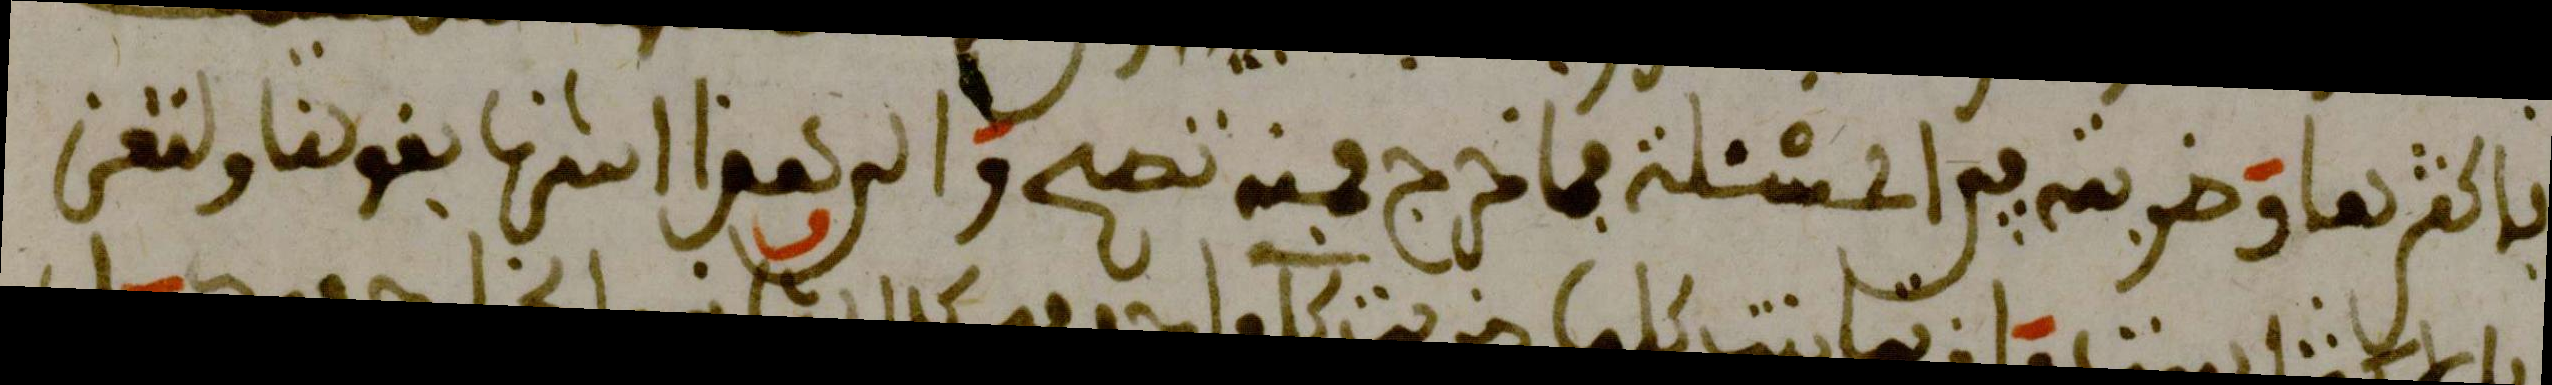باكثرها وَضربته في المسْئلة فما خرج فمنه تصح وَالى هذا اشرن بقولنا ولتغن
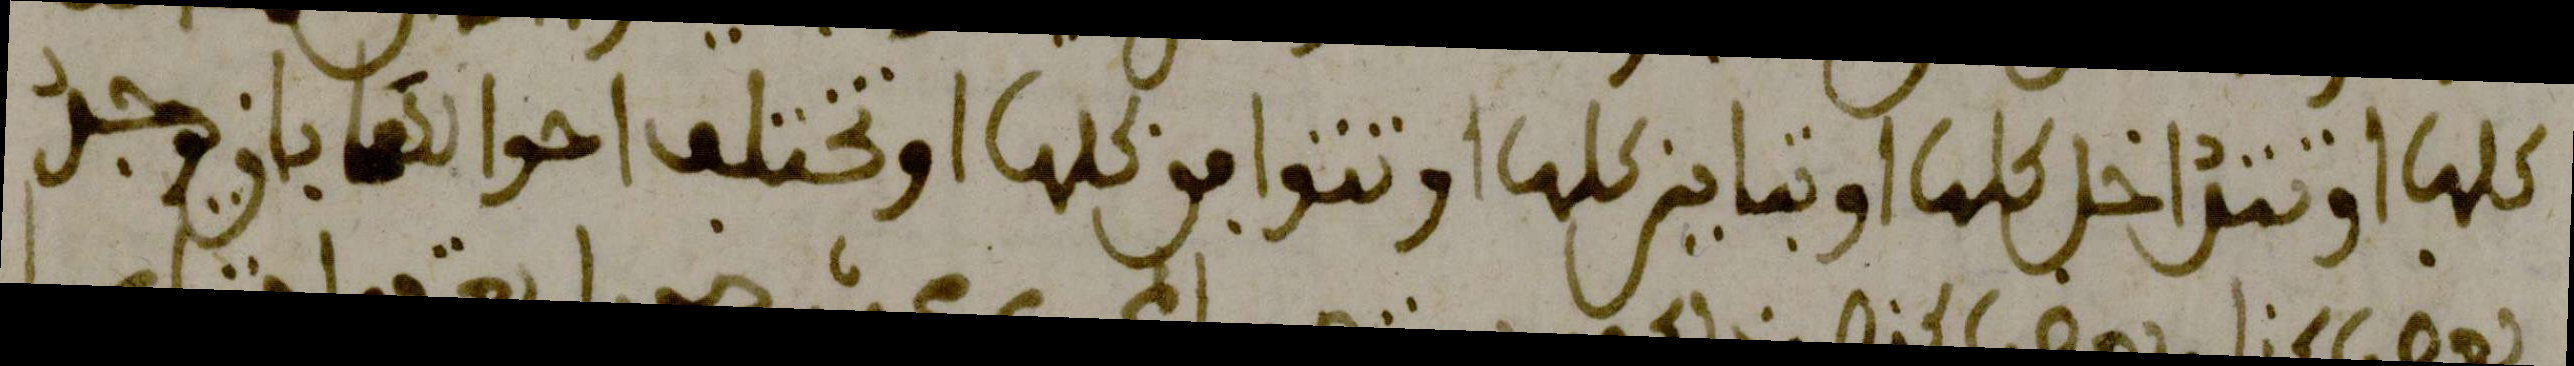كلها او تتدال كلها او تباين كلها او تتوافق كلها او تختلف احوالها بان يوجد
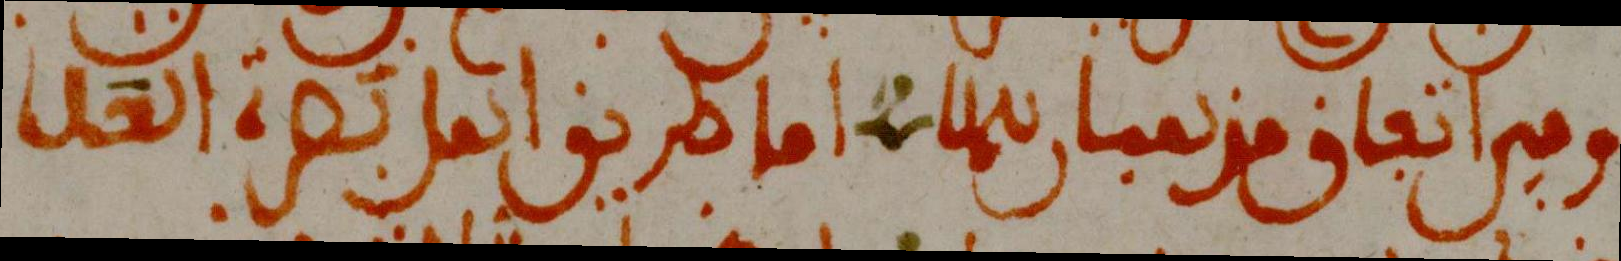وفي اتفاق مذهبان للملا اما طريق اهل بصرة العَلا
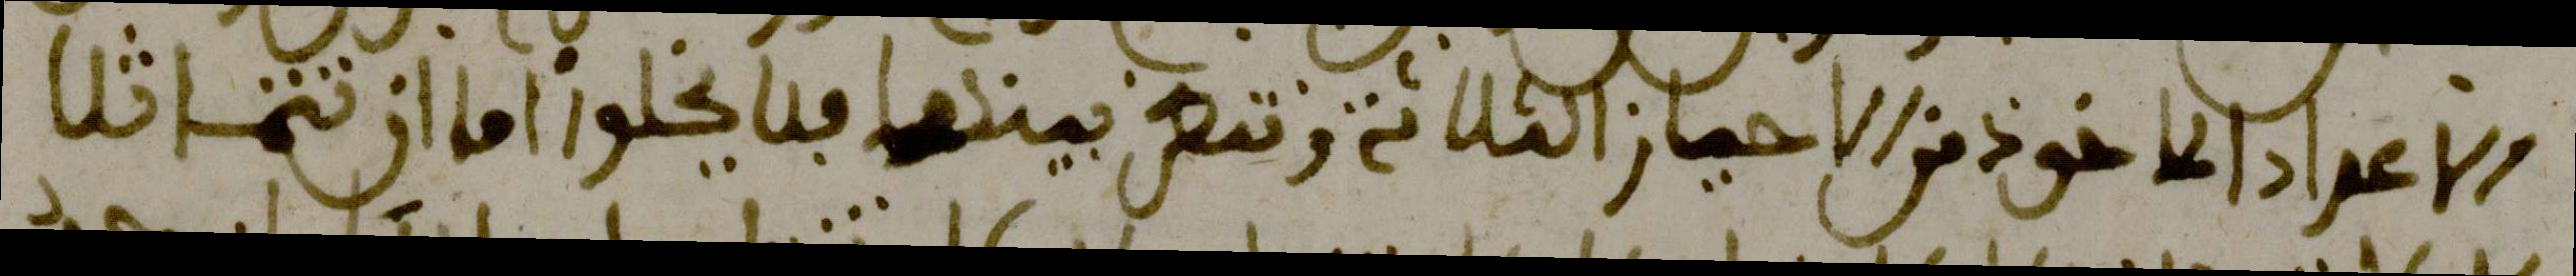الاعداد الماخوذ من الاحياز الثلاثة وتنظر بينها فلا يخلوا اما ان تتماثلا
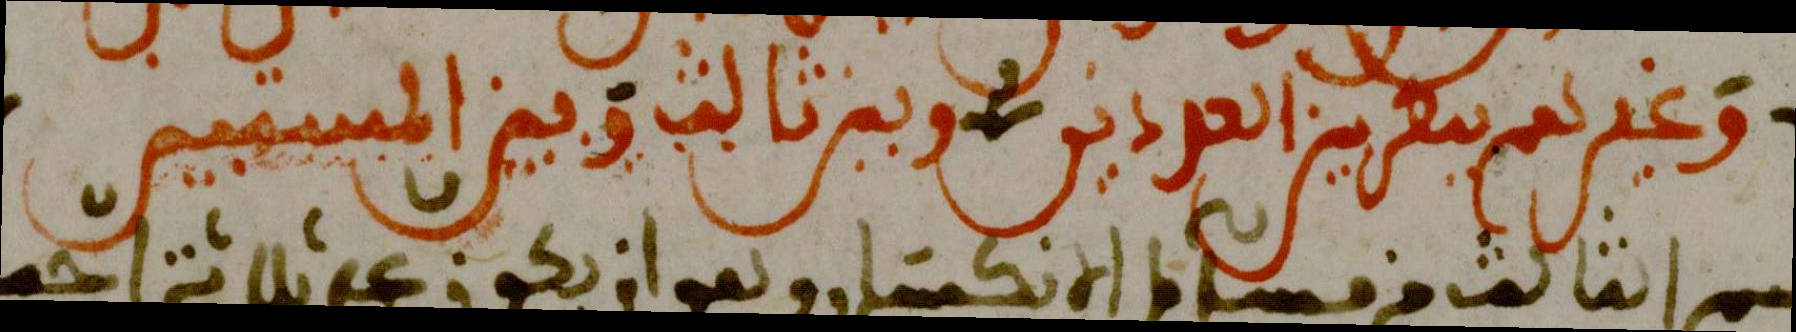وَغيرهم ينظر بين العددين وبين ثالث وَبين المستبين
